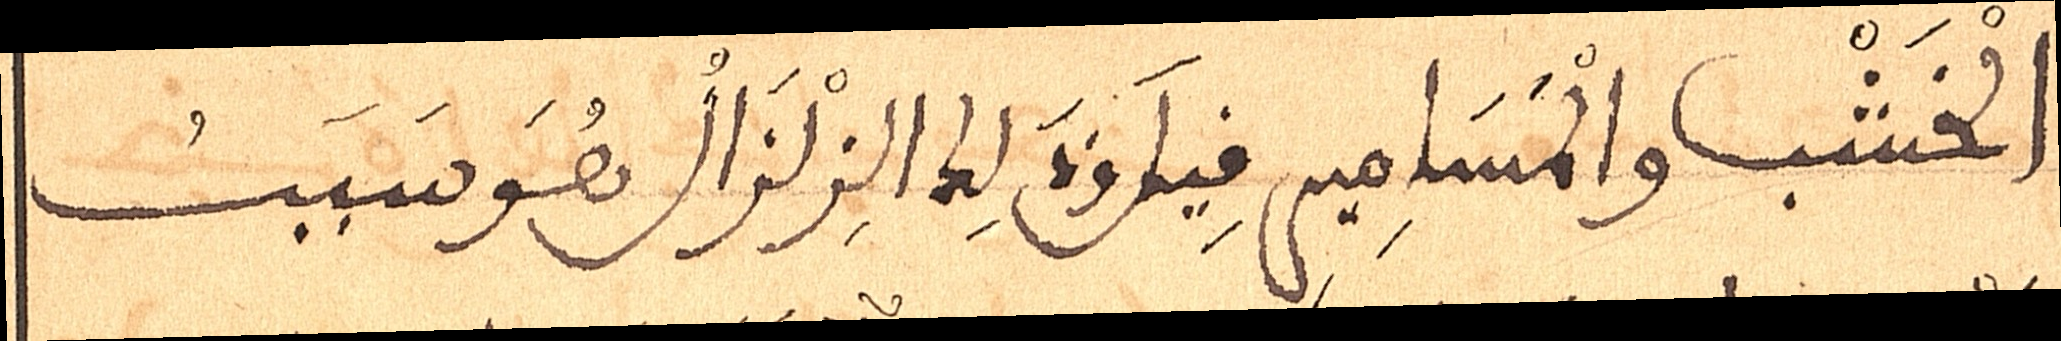الخشب والمسامير قيل وذلك الزلزال هو سبب
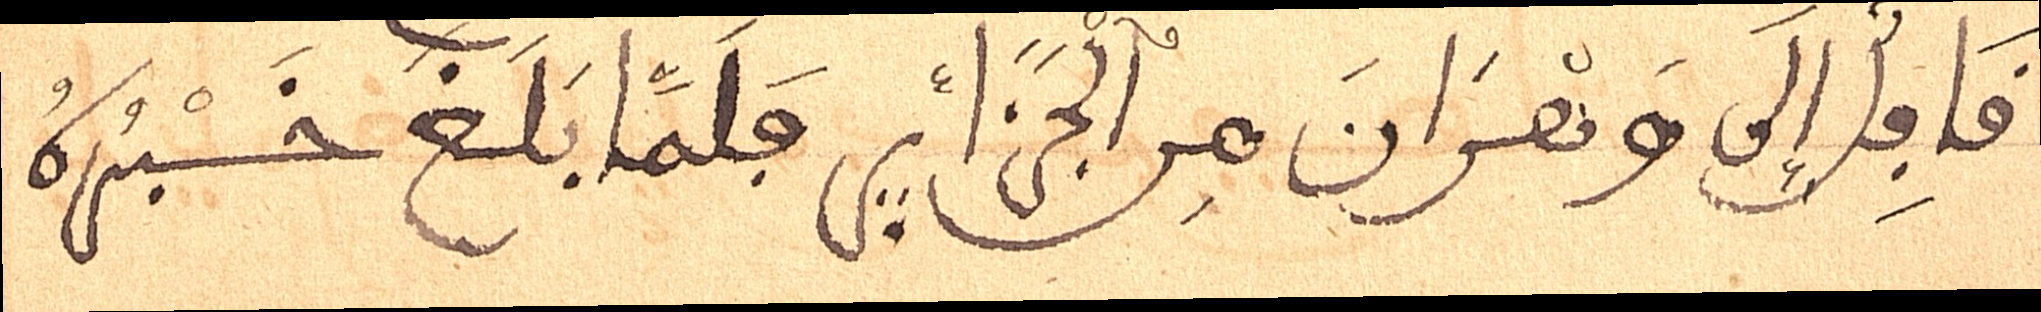قافل الى وهران من الجزائر فلما بلغ خبره
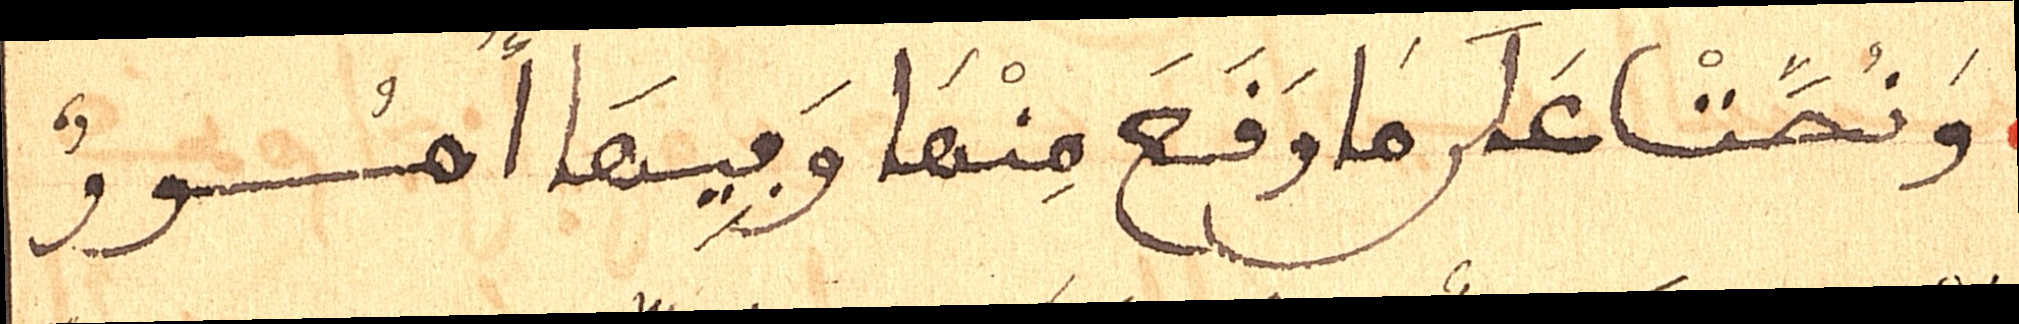ونصت على ما وقع منها وفيها امور
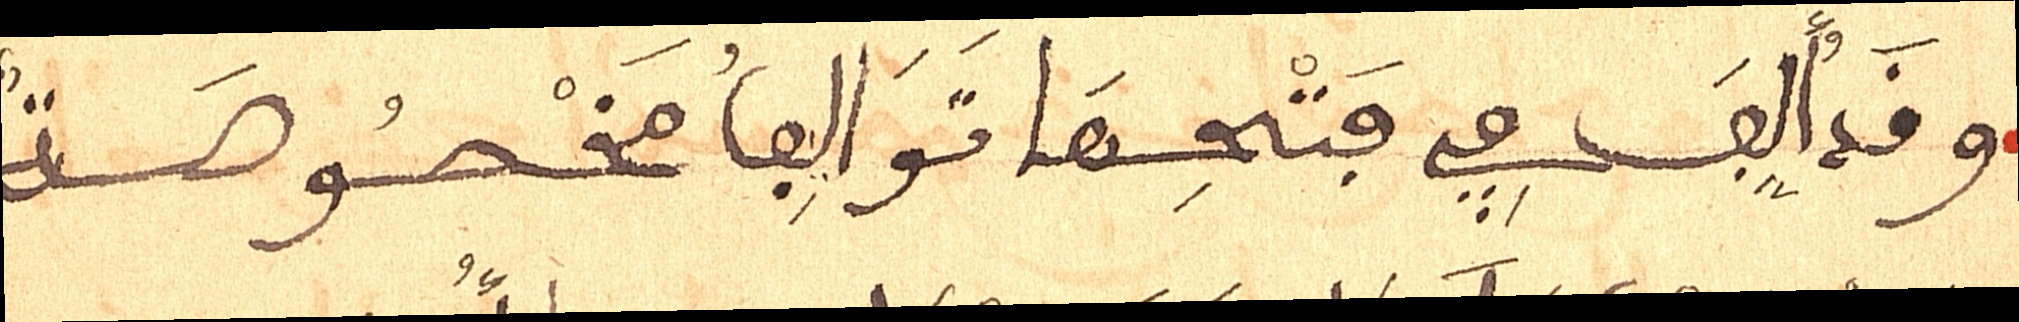وفد الف في فتحها توالف مخصوصة
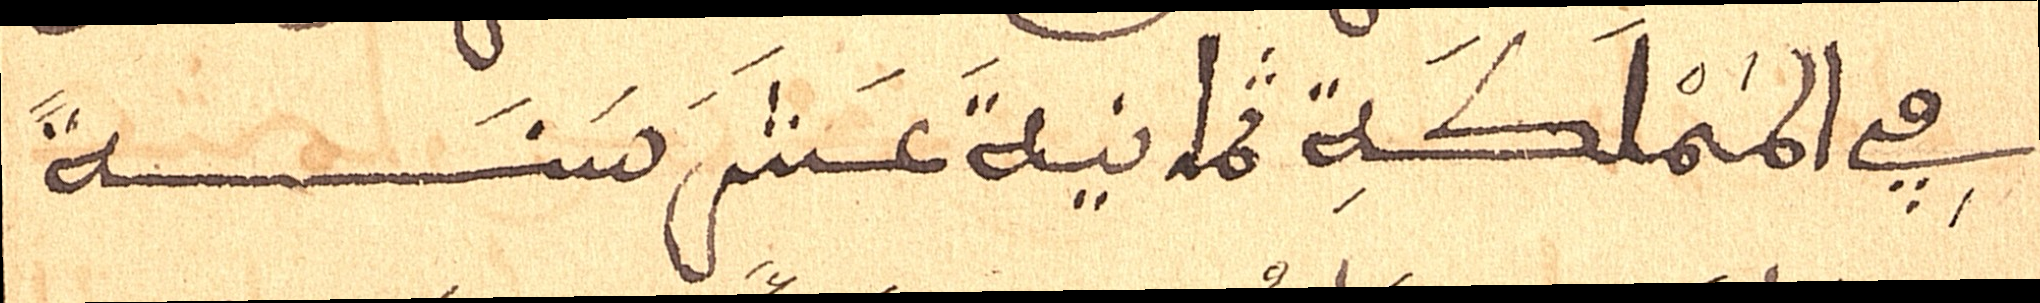في المملكة ثمانية عشر سنة
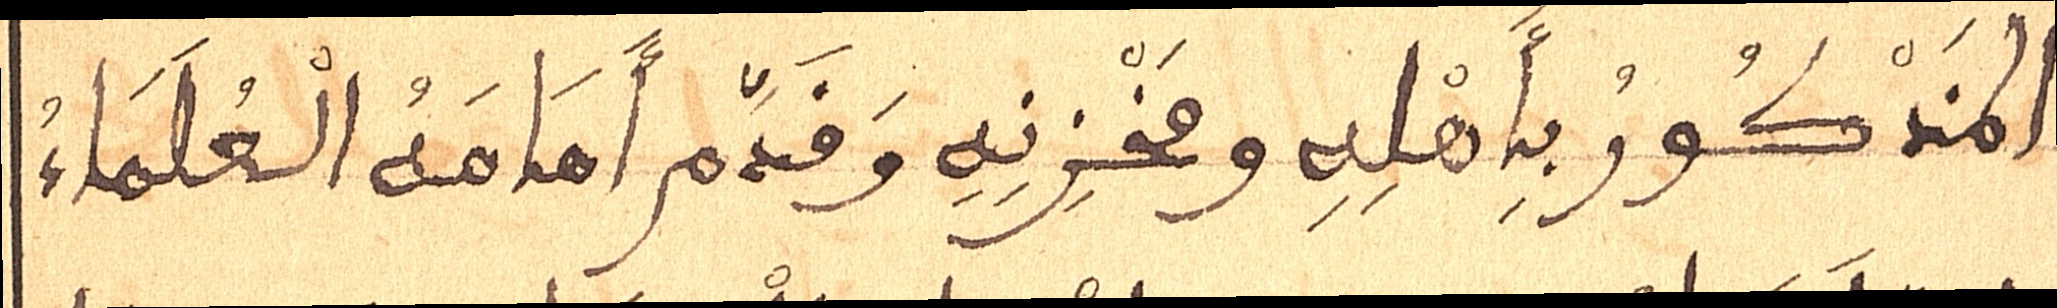المذكور باهله ومخزنه وقدم اهامه العلماء
